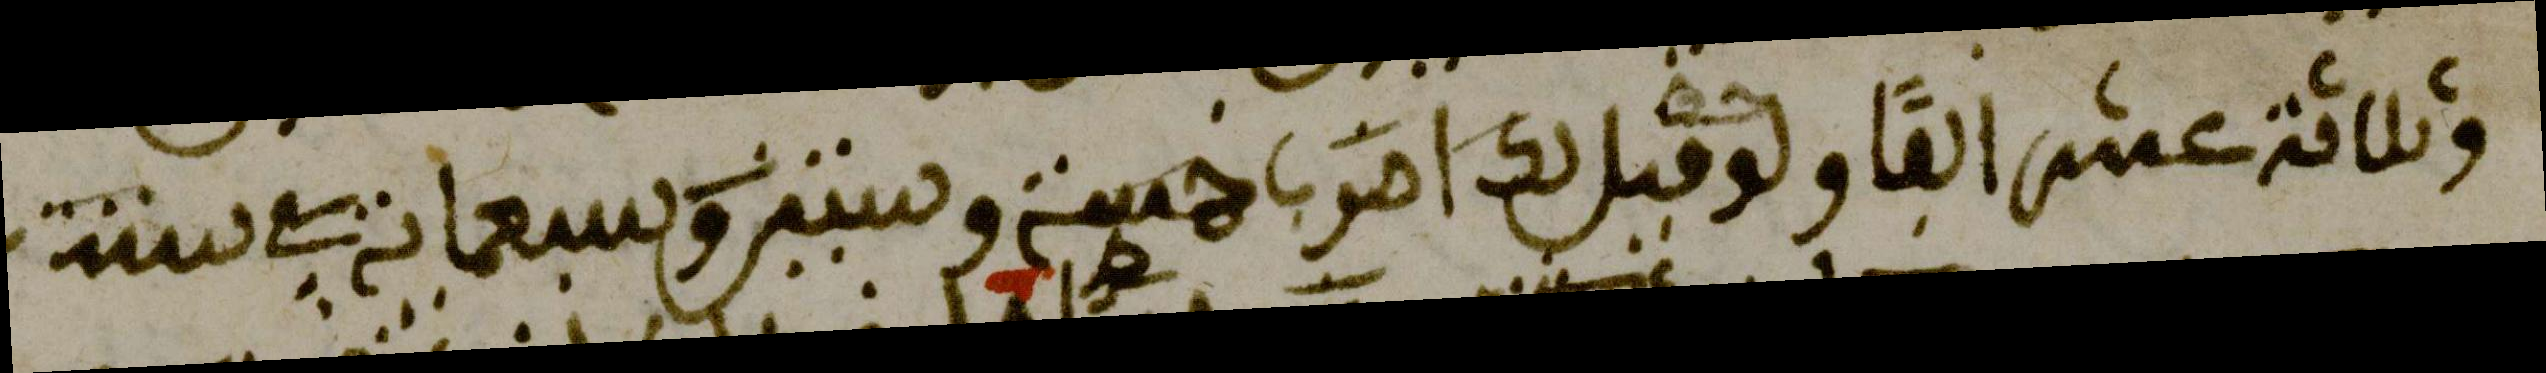و ثلاثة عشر الفا و لو قيل لك اضرب خمسة و ستين و سبعماية في ستة
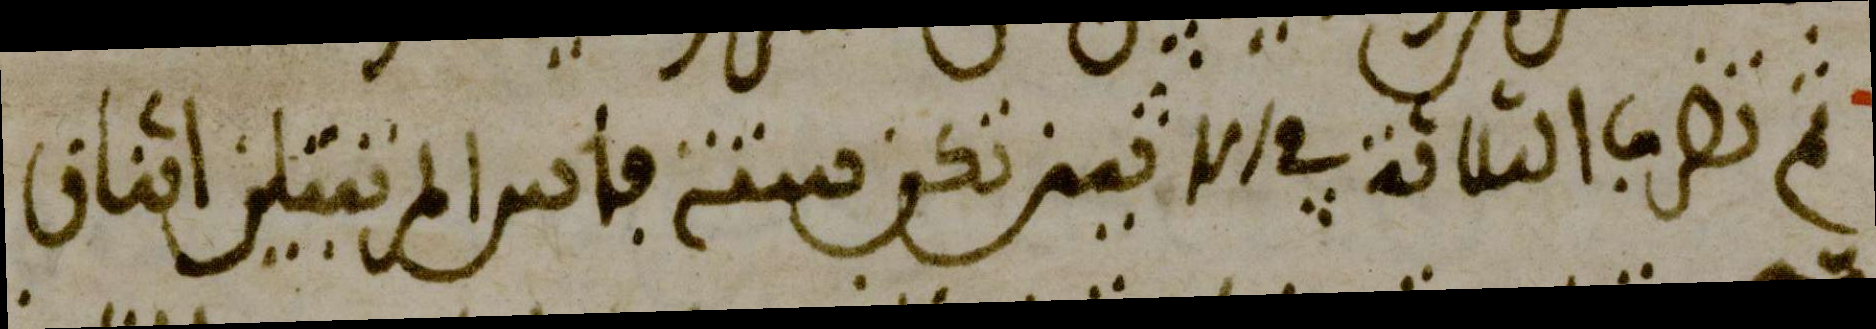ثم تضرب الثلاثة في الاثنين تكن ستة فاس المرتبتين اثنان
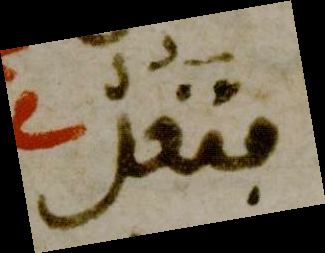فتعد
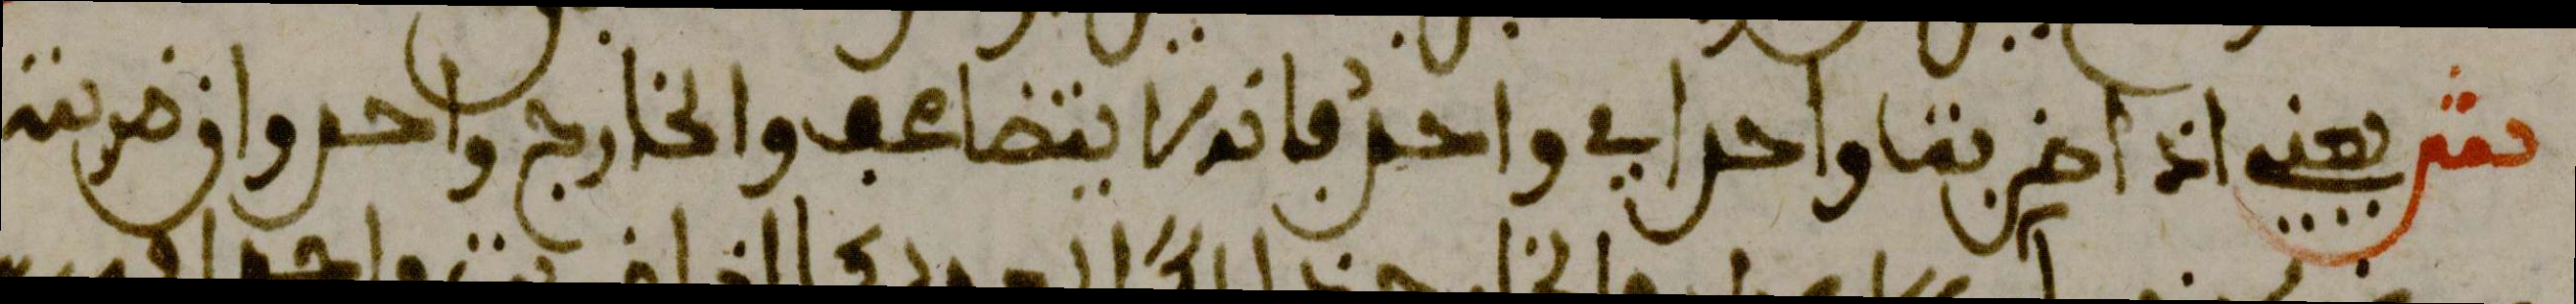ش يعني اذا ضربت واحدا في واحد فانه لا يتضاعف و الخارج واحد و ان ضربته
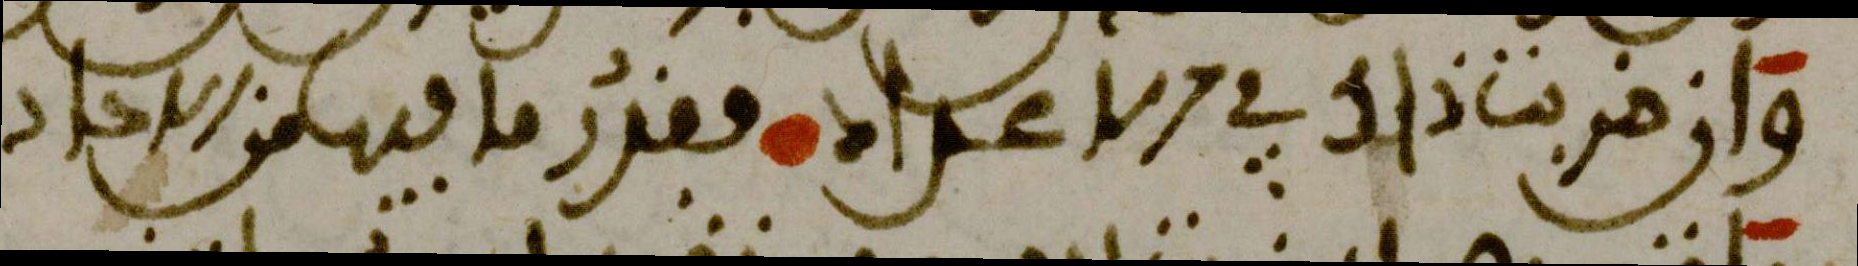و ان ضربت ذلك في الاعداد فقدر ما فيها من الاعداد
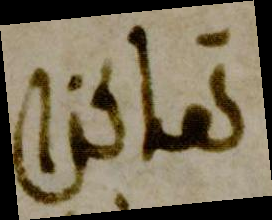هاكذا
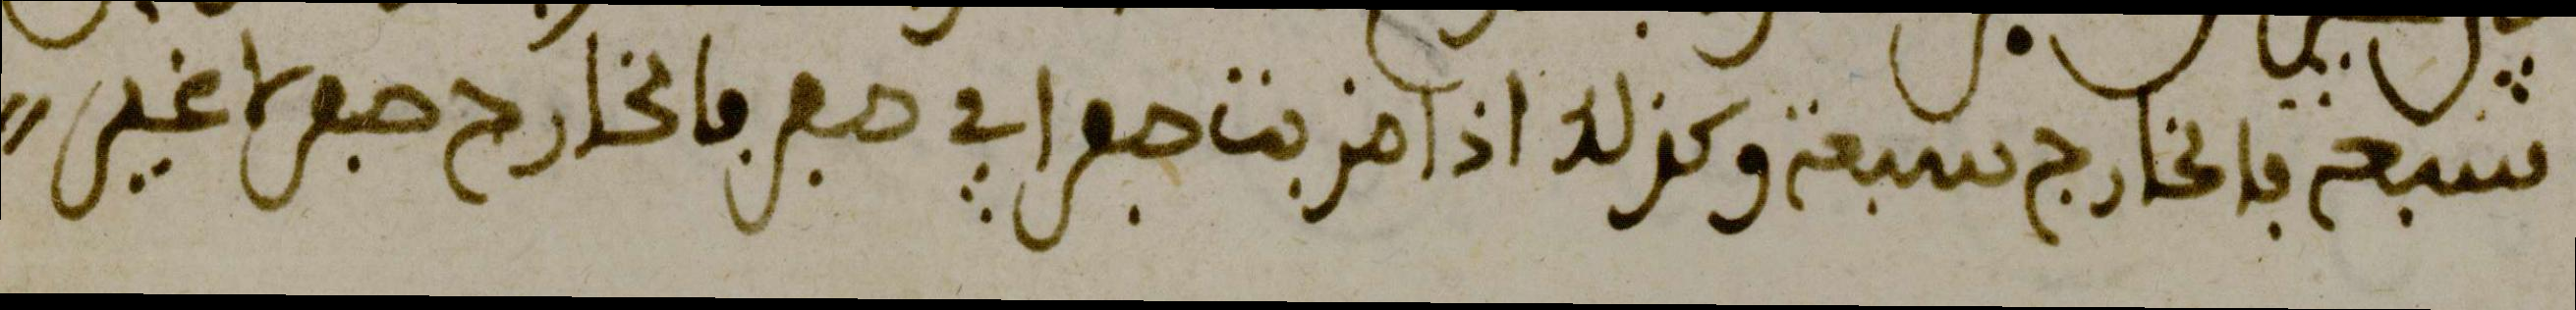سبعة فالخارج سبعة و كذلك اذا ضربتت صفرا في صفر فالخارج صفره غير
